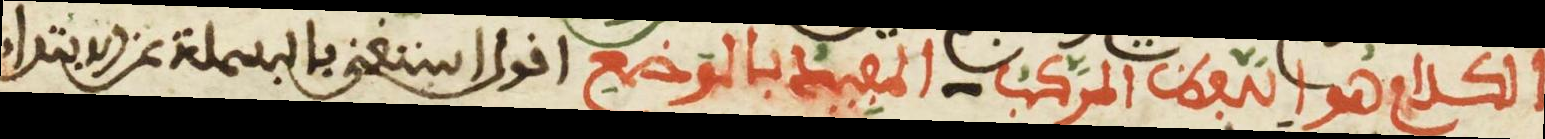الكلام هو اللفظ المركب – المفيد بالوضع أقول استغنى بالبسملة عن الابتداء
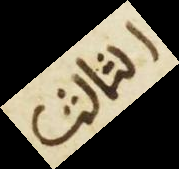الثالث
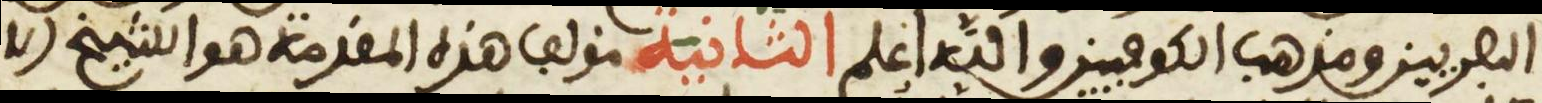البصريين و مذهب الكوفيين و الله اعلم الثانية مؤلب هذه المقدمة هو اللشيخ الا
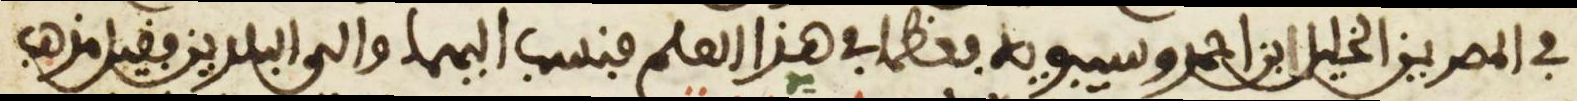في المصرين الخليل بن احمد و سيبويه فعظما في هذا العلم فنسب اليهما و الى البلدين فقيل مذهب
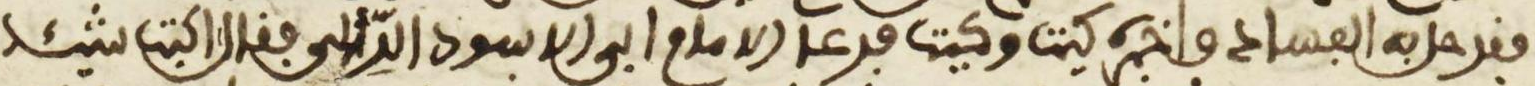فقد حل به الفساد و اخبره كيت و كيت فرعا الامام ابى الاسود الدءلى فقال اكبت شيئا
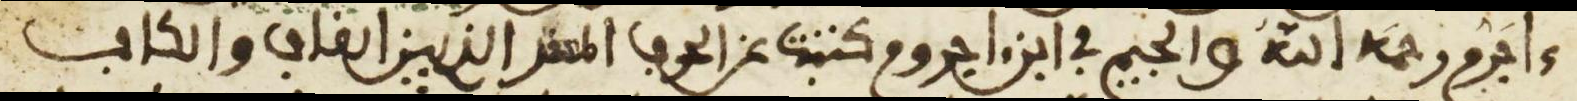أجرم رحمه الله و الجيم في ابن اجروم كتبت عن الحرف الم# الذ#بين القاف و الكاف
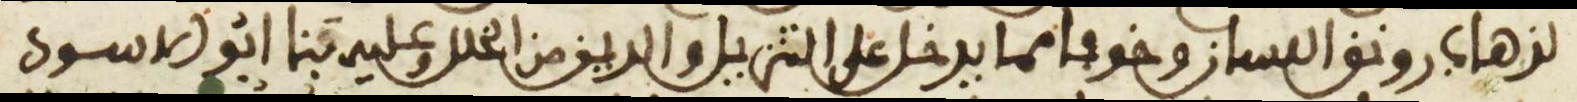لذهاب رونق اللسان و خوفا مما يدخل على التنزيل و الدين ض الخلل و عليه بنا انو الاسود
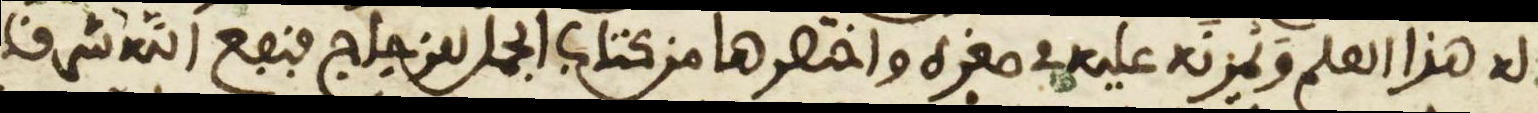له هذا العلم و ليزنه عليه في صغره و اختصرها من كتاب الجمل للزجاج فنفع الله شرقا
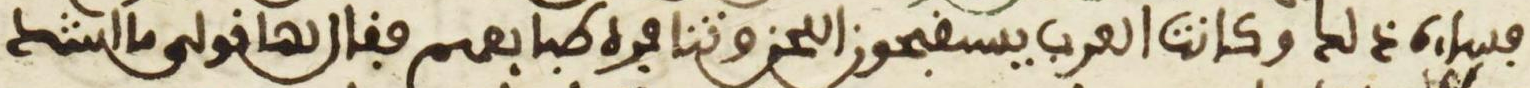فساءه ذلك وكانت العرب يستقبحون اللحن و ثنافره طبائعمم فقال لها قولى ما اشد
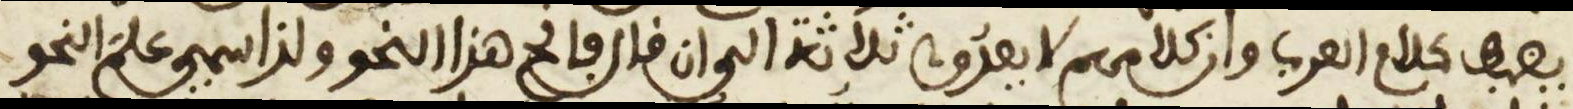يضبط كلام العرب و ان كلامهم لا يعدو ثلاثة الى ان قال فانح هذا النحو و لذا سمي علم النحو
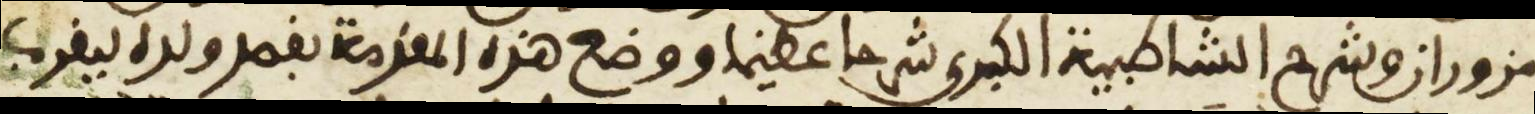مزوران و شرح الشاطبية الكبرى شرحا عظيما و وضع هذه المقدمة بقصد ولده ليقرب
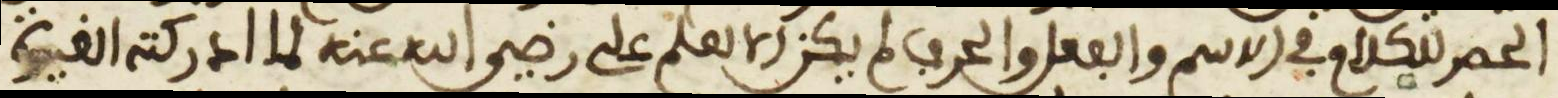الحمر للكلام في الاسم والفعل والحرف لم يكن الا لعلم على رضي الله عنه لما ادركته الغيرة
